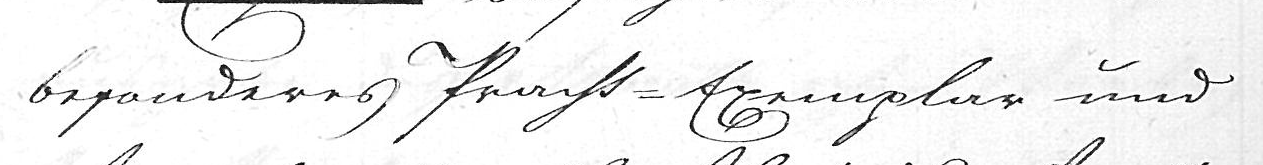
besonderes Pracht-Exemplar und
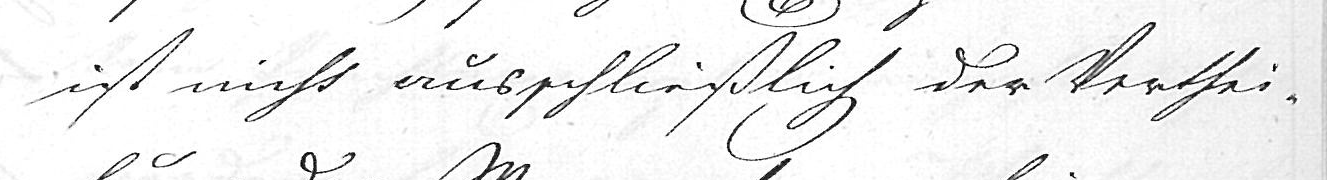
ist nicht ausschließlich der Verthei
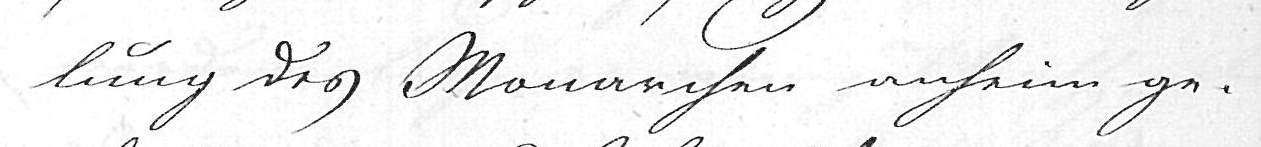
lung der Monarchen anheim ge-
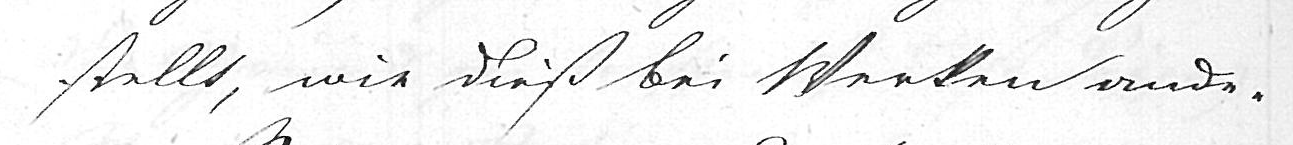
stellt, wie dieß bei Werken ande-
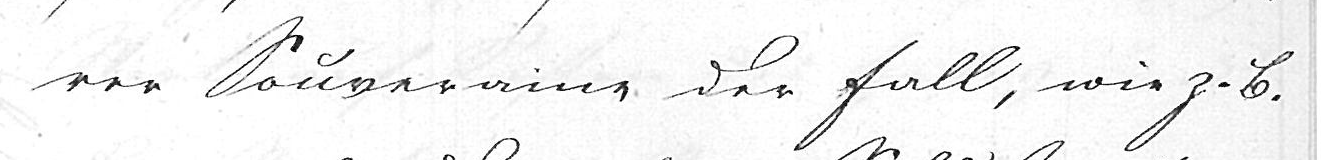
rer Souveraine der Fall, wie z.B.
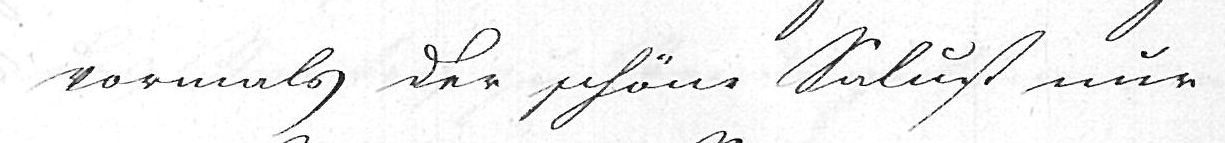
vormals der schöne Salust nur
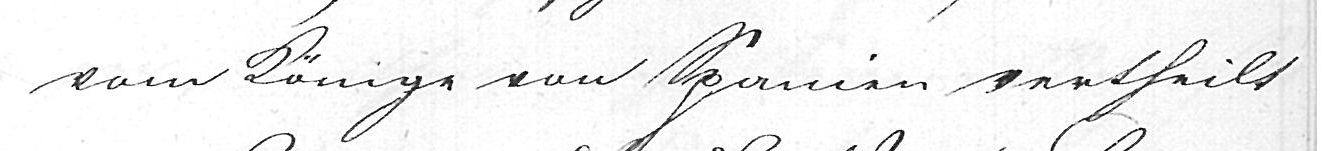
vom Könige von Spanien vertheilt
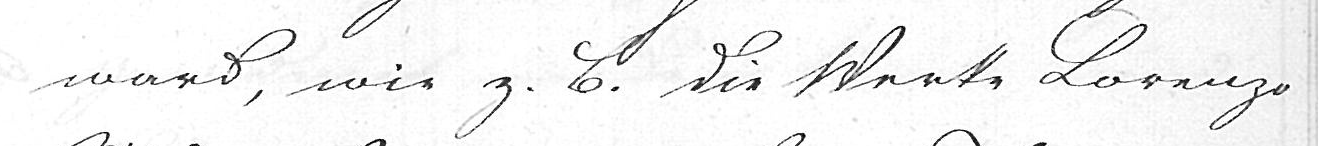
ward, wie z.B. die Werke Lorenzo
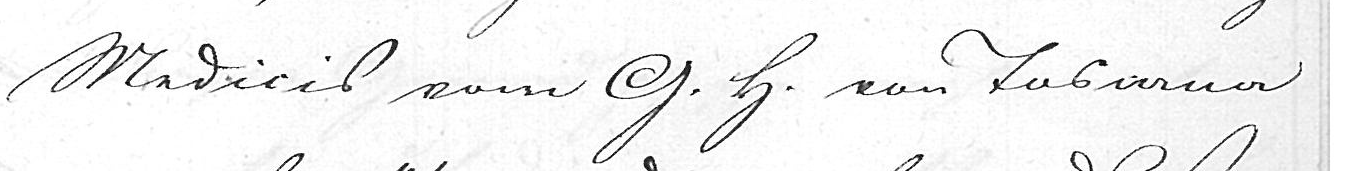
Medicis vom G.H von Toscana
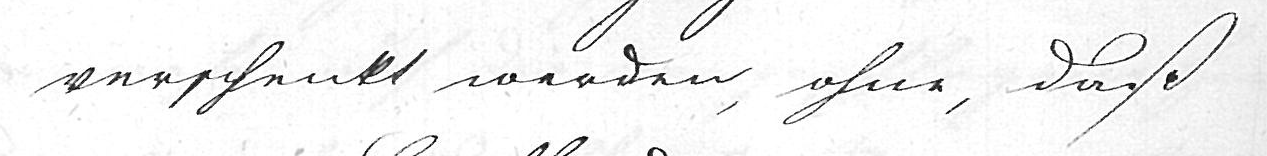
verschenkt werden, ohne, daß
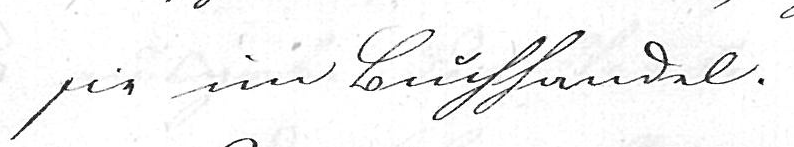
sie im Buchhandel.
